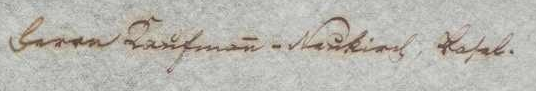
Herrn Kaufmann-Neukirch, Basel.
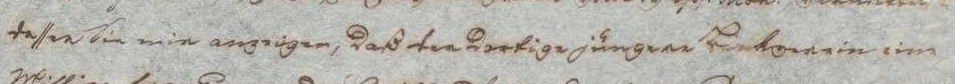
dessen Sie mir anzeigen, daß der dortige jüngere Bankverein eine
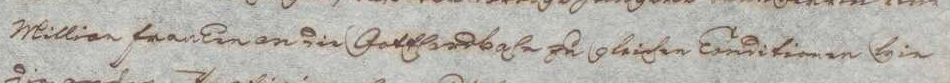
Million Franken die Gotthardbahn zu gleichen Conditionen wie
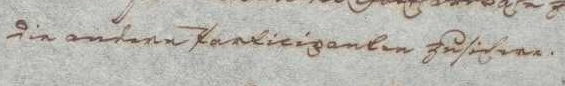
die andern Participanten zusichern.
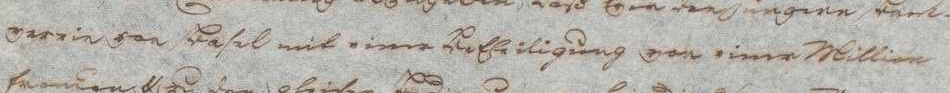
verein von Basel mit einer Betheiligung von einer Million
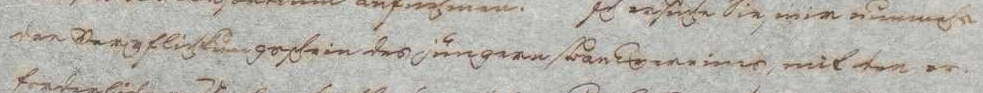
den Verpflichtungsschein des jüngern Bankvereins, mit den er-
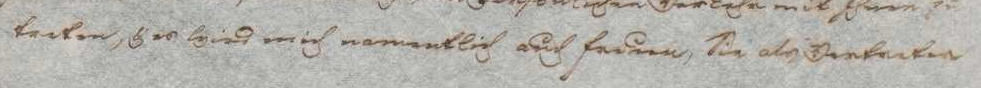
treten, & es wird mich namentlich auch freuen, Sie als Vertreter
